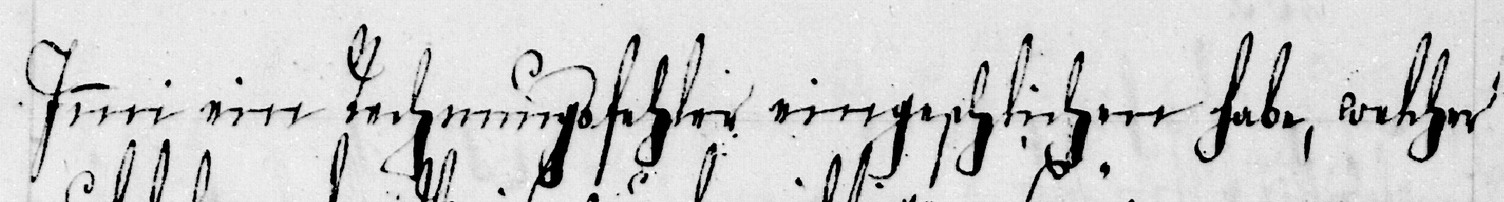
Immi ein Rechnungsfehler eingeschlichen habe, welcher
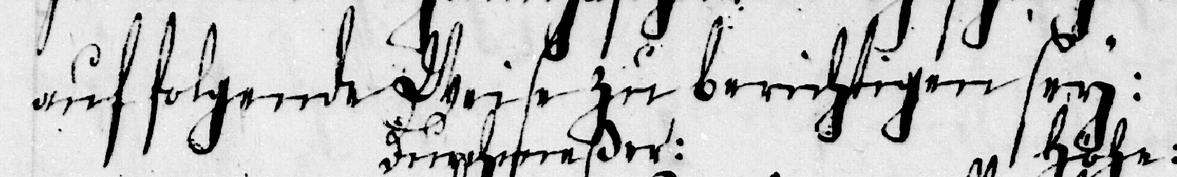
auf folgende Weise zu berichtigen sey:
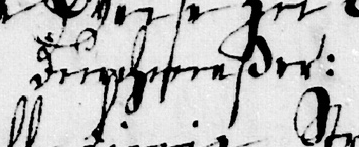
Durchmeßer:
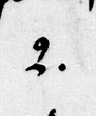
2.
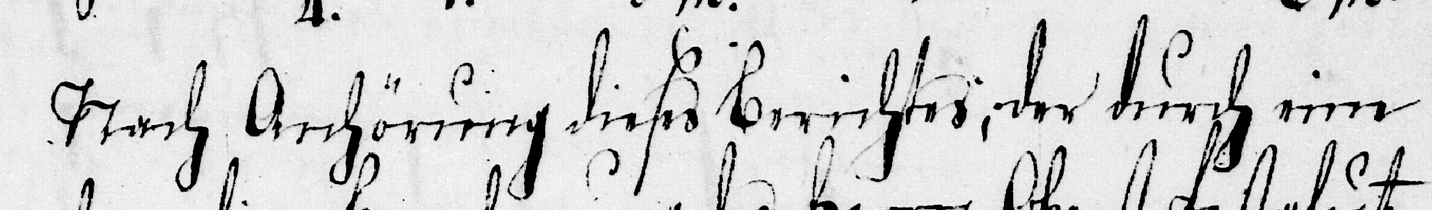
Nach Anhörung dieses Berichtes, der durch eine
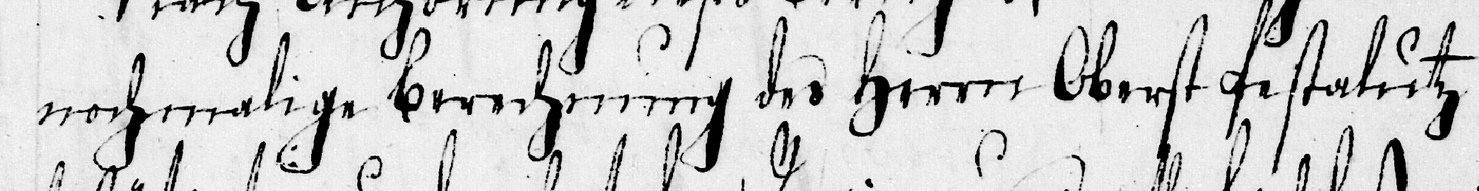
nochmalige Berechnung des Herrn Oberst Pestalutz
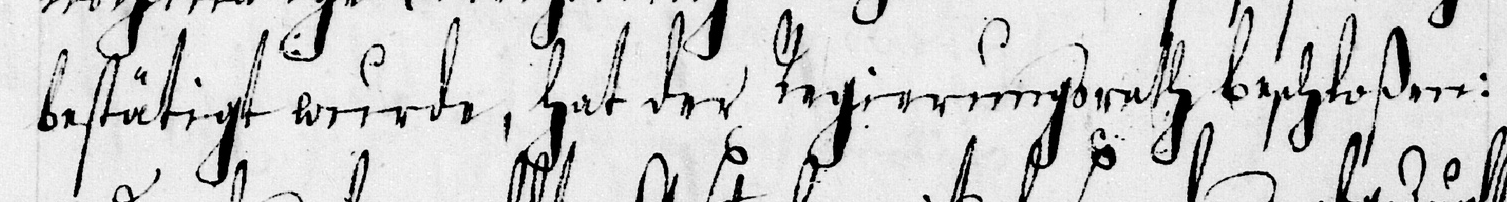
bestätigt wurde, hat der Regierungsrath beschloßen:
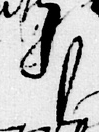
4.
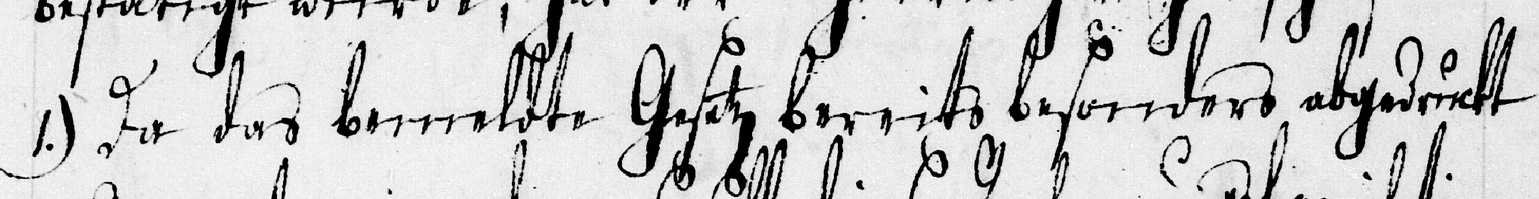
1.) Da das bemeldte Gesetz bereits besonders abgedruckt
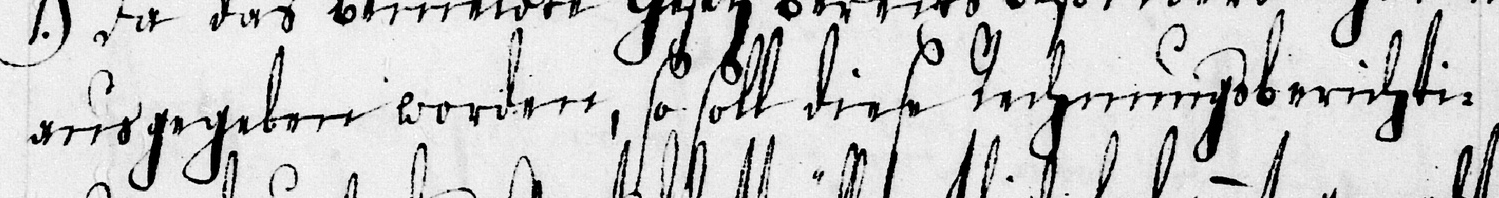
ausgegeben worden, so soll diese Rechnungsberichti¬
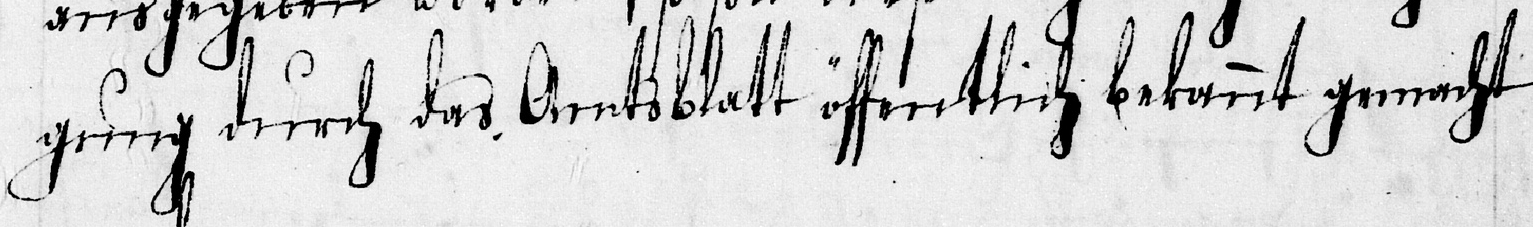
gung durch das Amtsblatt öffentlich bekannt gemacht
